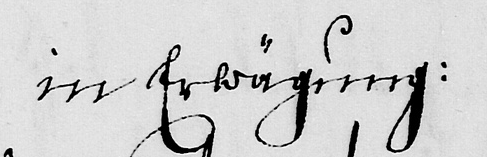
in Erwägung:
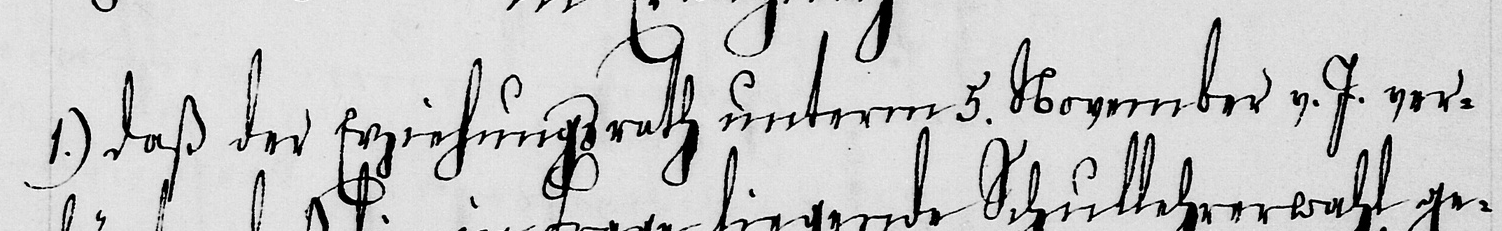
1.) daß der Erziehungsrath unterm 5. November v. J. ver¬
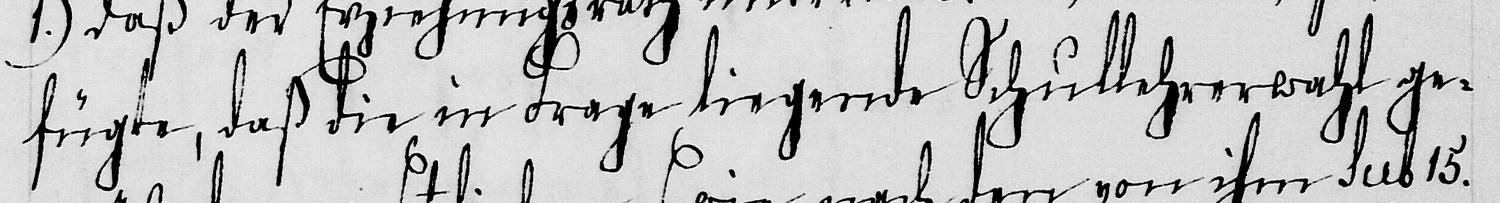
fügte, daß die in Frage liegende Schullehrerwahl ge¬
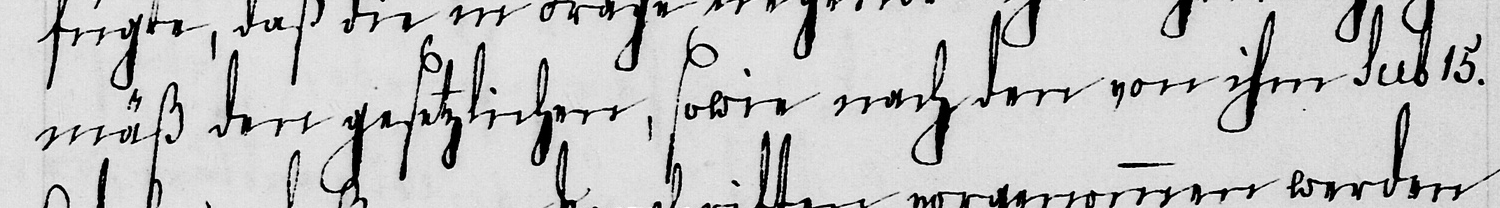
mäß den gesetzlichen, sowie nach den von ihm sub 15.
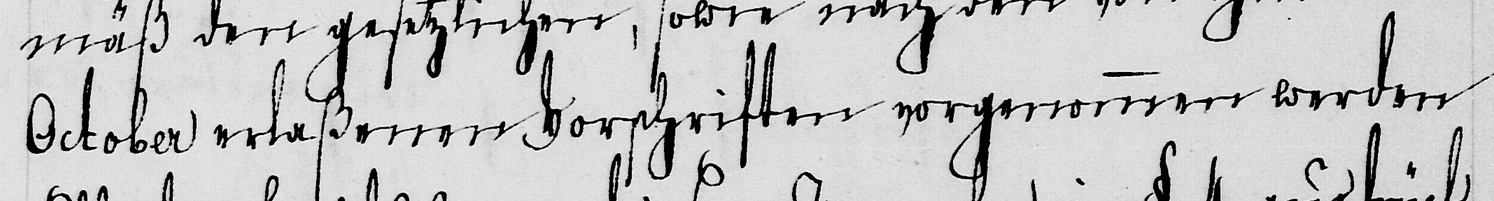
October erlaßenen Vorschriften vorgenommen werden
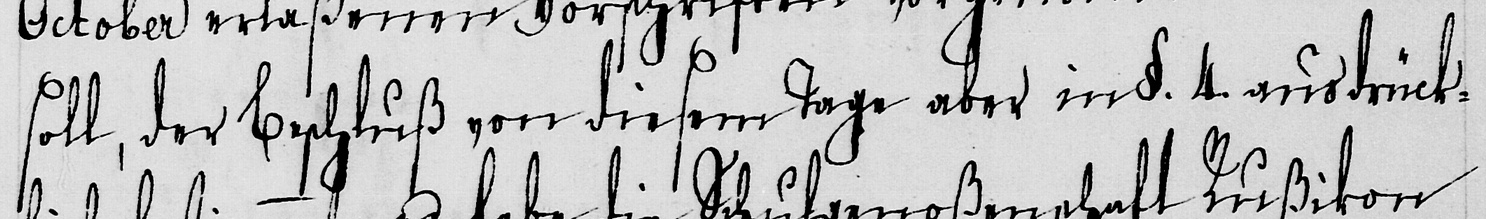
soll, der Beschluß von diesem Tage aber in §. 4. ausdrück¬
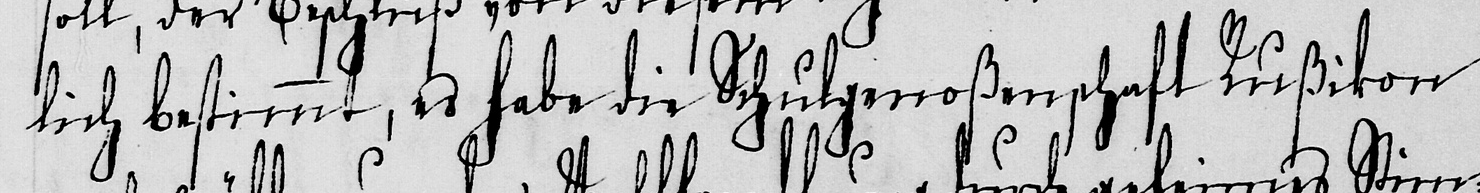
lich bestimmt, es habe die Schulgenoßenschaft Rußikon
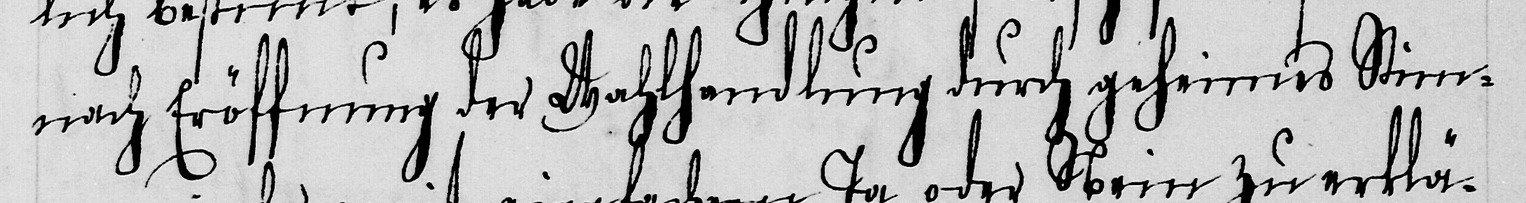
nach Eröffnung der Wahlhandlung durch geheimes Stim¬
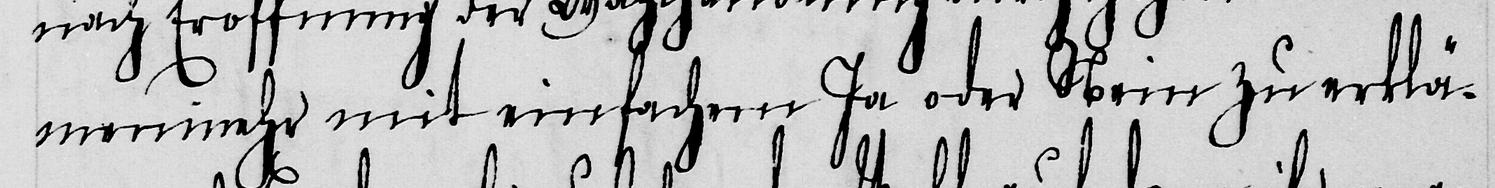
menmehr mit einfachem Ja oder Nein zu erklä¬
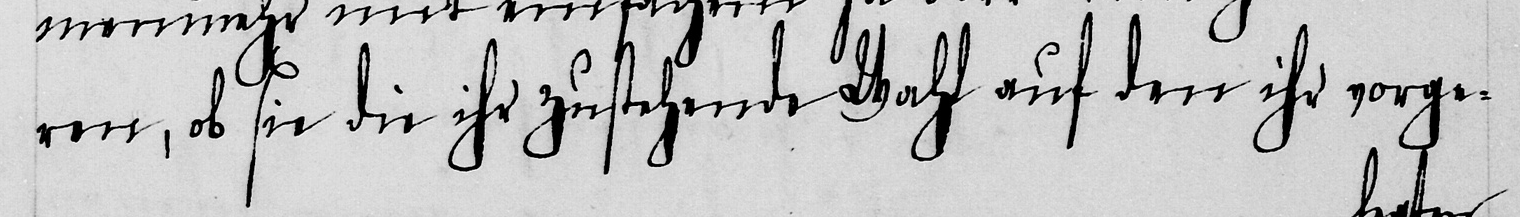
ren, ob sie die ihr zustehende Wahl auf den ihr vorge-
